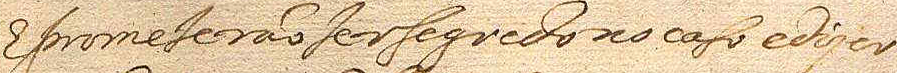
E prometeraõ ter segredo no caso e dizer
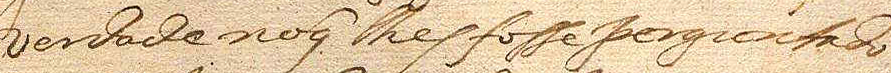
verdade no q̄ lhes fosse perguntado
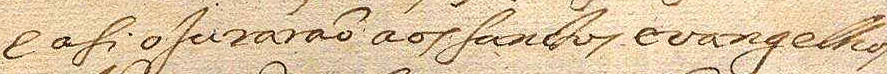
E asi o Juraraõ aos sanctos evangelhos
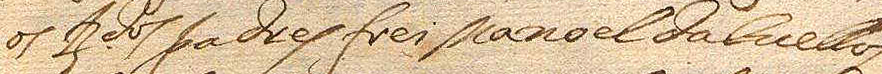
os R.dos padres frei Manoel daluellos
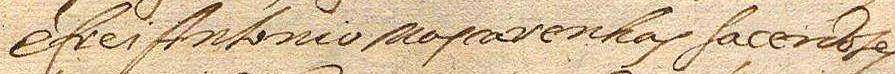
e frei Antonio Mascarenhas saçerdotes
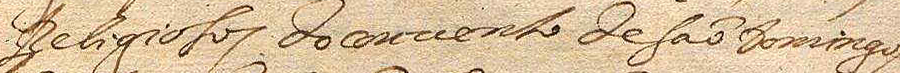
Religiosos do conuento de saõ Domingos
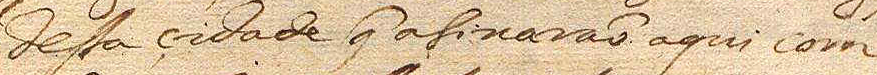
desta çidade q̄ asinaraõ aqui com
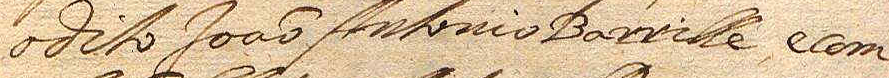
o dito Joaõ Antonio Barrille, e com
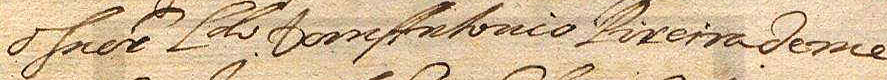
o snor̄ Ldo Dom Antonio Pireira de me
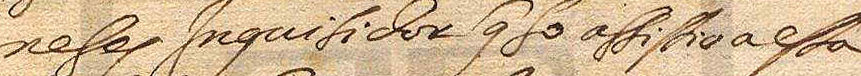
neses Jnquisidor q̄ so assistio a esta
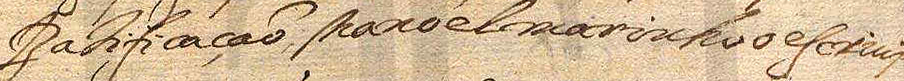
Ratificaçaõ, Manoel marinho o escriuj
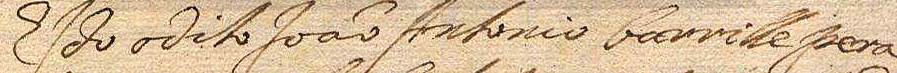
E Jdo o dito Joaõ Antonio barrille pera
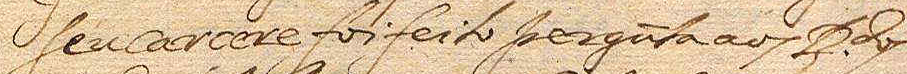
seu carçere foi feito pergūta aos R.dos
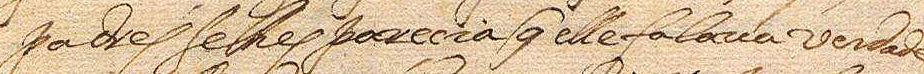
padres se lhes pareçia q̄ elle falaua verdade
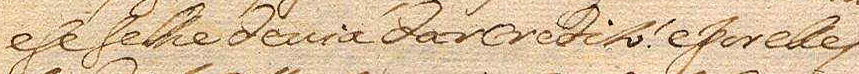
e se se lhe deuia dar credito? e por elles
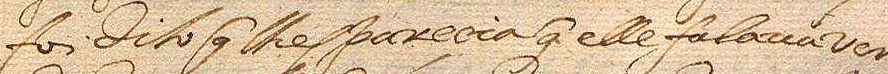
foi dito q̄ lhes pareçia q̄ elle falaua ver
